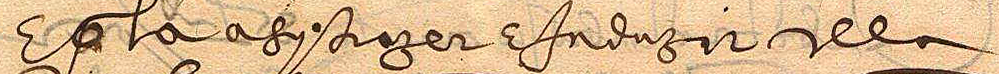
E p̄la asy trazer E Jnduzir ella
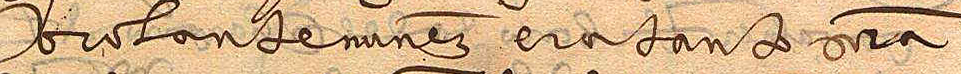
Violante nun̄ez era tanto s̄ora
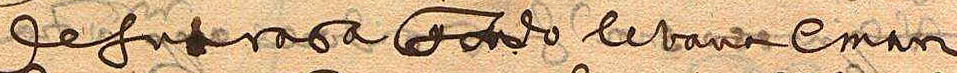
de sua casa q̄ tudo levaua e man
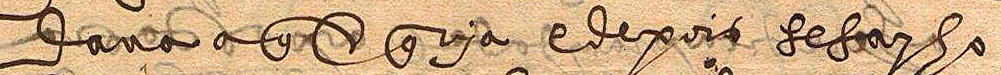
daua a q̄ ēq̄rya e depois se sahjo
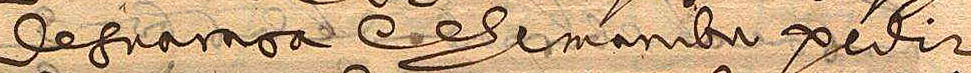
de sua casa e lhe mandou pedir
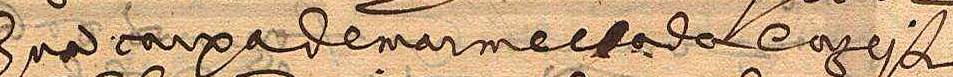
hua caixa de marmellada e azejte
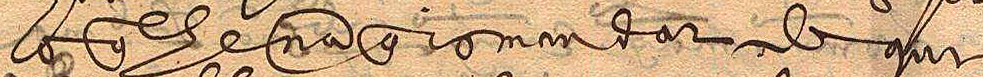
o q̄ lhe nā q̄is mandar do que
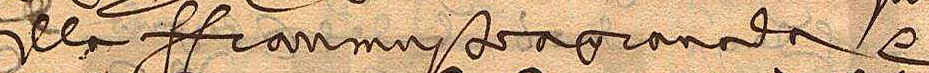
ella fficou mujto agrauada e
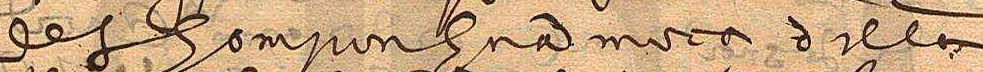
deshomrrou huā moça della
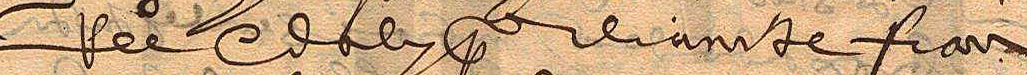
Ree e daly por diamte ficou
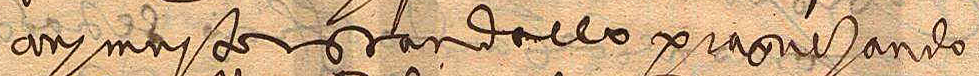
com mujto escandallo pragueJando
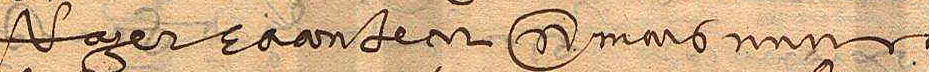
ffazer E acontecer sē mais nunca
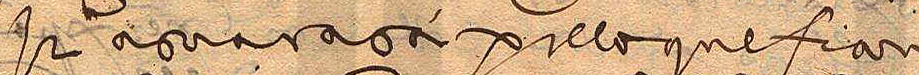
Jr a sua casa pello que ficou
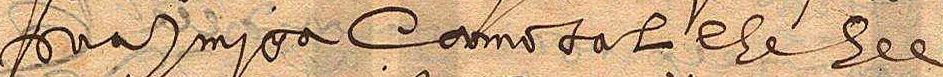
sua Jmjga e como taL lhe hee
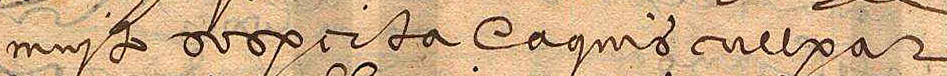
mujto sospeita e a quis cullpar
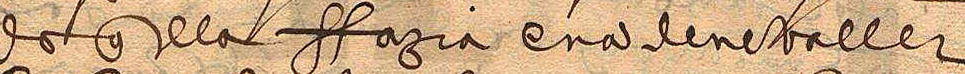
do q̄ ella ffazia e nā deue valler
